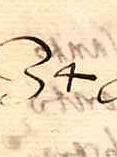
34
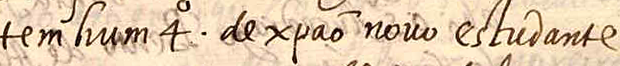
tem hum 4º. de xpaõ nouo estudante
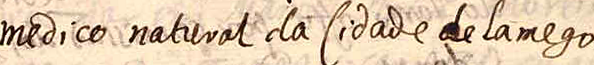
medico natural da Cidade de lamego
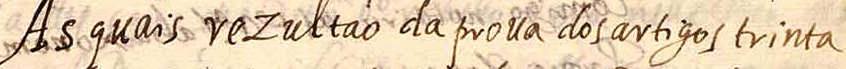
As quais rezultaõ da proua dos artigos trinta
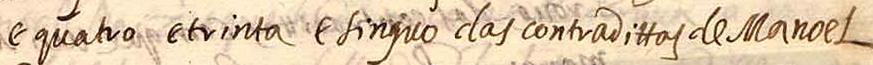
e quatro e trinta e sinquo das contradittas de ManoeL
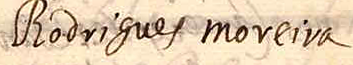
Rodrigues moreira
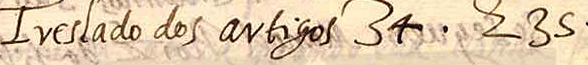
Treslado dos artigos 34. E 35.
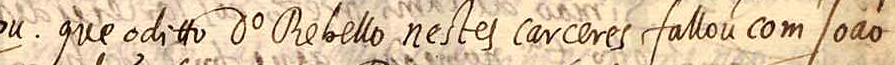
ꝓu. que o ditto Do Rebello nestes carceres fallou com Joaõ
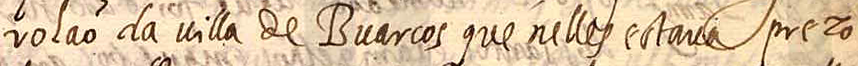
rolão da uilla de Buarcos que nelles estaua prezo
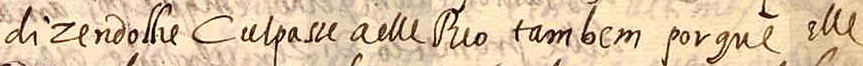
dizendolhe Culpasse a elle Reo tambem porque Elle
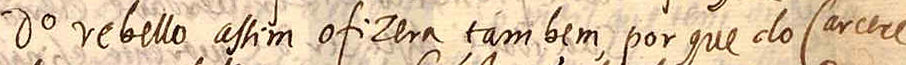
Do rebello assim o fizera tambem, porque do Carcere
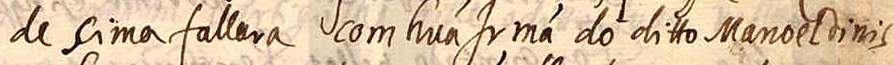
de sima fallara com huā Jrmā do ditto Manoel dinis
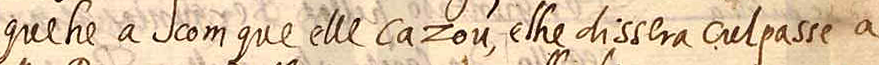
que he a com que elle cazou, e lhe dissera culpasse a
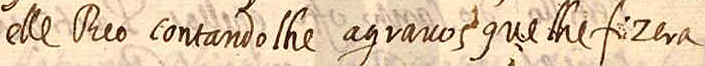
elle Reo contandolhe agrauos que lhe fizera
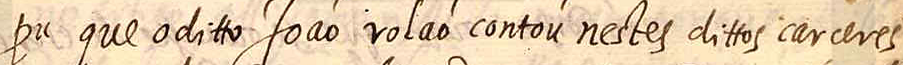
ꝓu que o ditto Joaõ rolaõ contou nestes dittos carceres
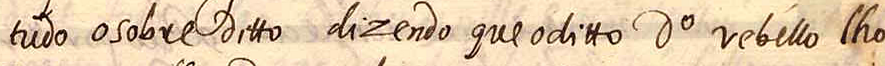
tudo o sobreditto dizendo que o ditto Do rebello lho
